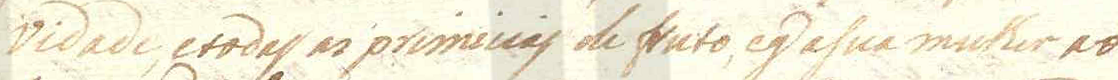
vidade, e todas as primicias de fruto, e q̄ a sua mulher ao
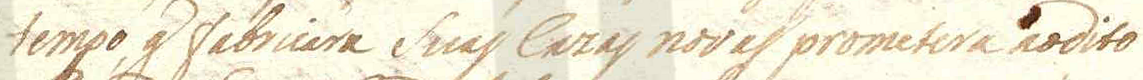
tempo, q̄ fabricara suas Cazas novas prometera ao dito
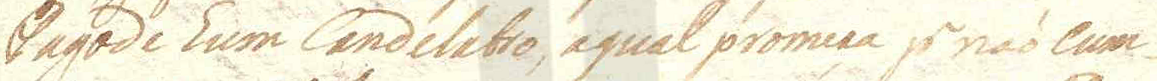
Pagode hum Candelabro, a qual promesa pr naõ cum
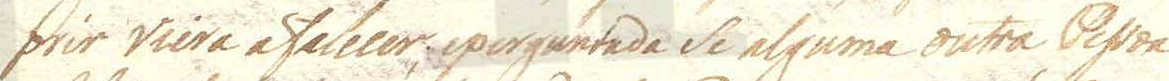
prir viera a falecer, e perguntada se alguma outra Pessoa
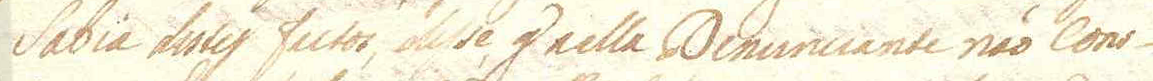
Sabia desses factos, disse, q̄ a ella Denunciante naõ cons
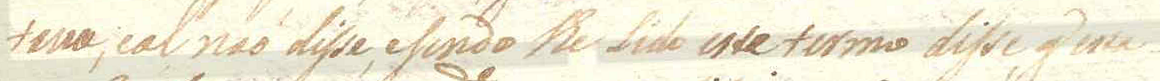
tava, e al naõ disse, e sendo lhe Lido este termo disse q̄ esta
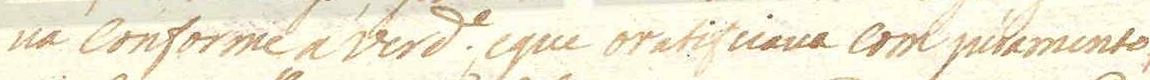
ua Conforme a verd.e, e que o ratificaua com juramento,
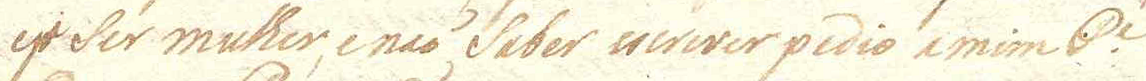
e pr Ser mulher, e naõ Saber escrever pedio a mim P.e
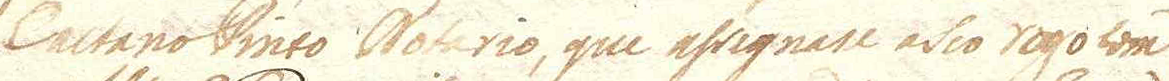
Caetano Pinto Notario, que assegnase a Seo rogo com
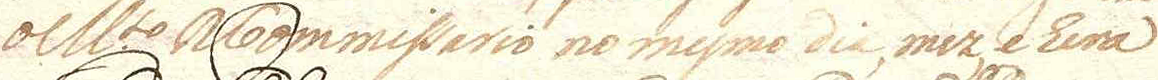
o M.to R Commissario no mesmo dia, mez e hera
